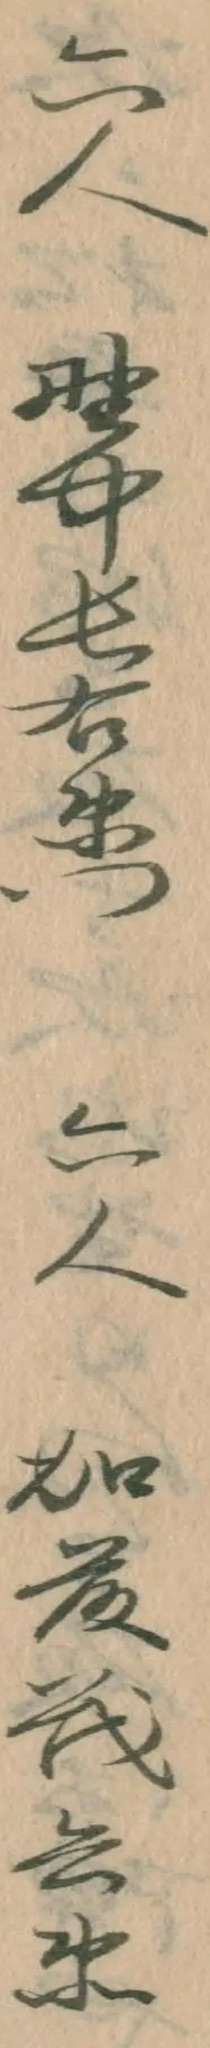六人野中長右衛門六人加藤茂兵衛
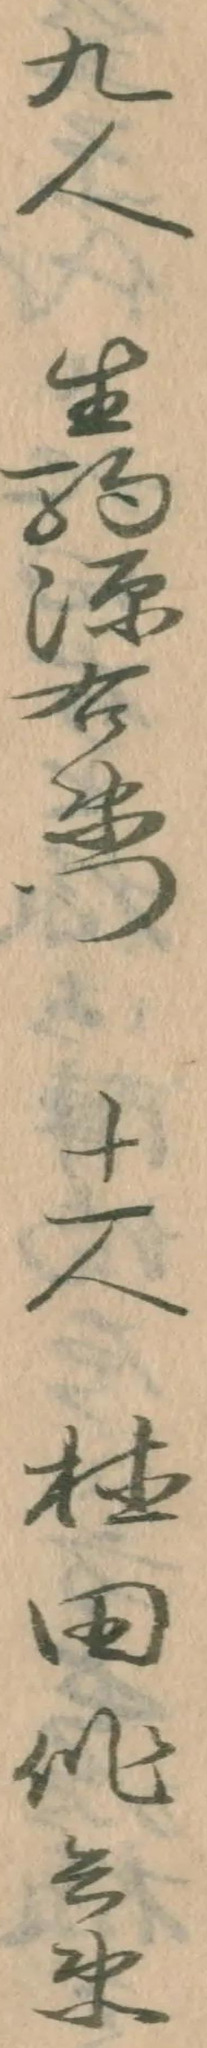九人生駒源右衛門十一人植田作兵衛
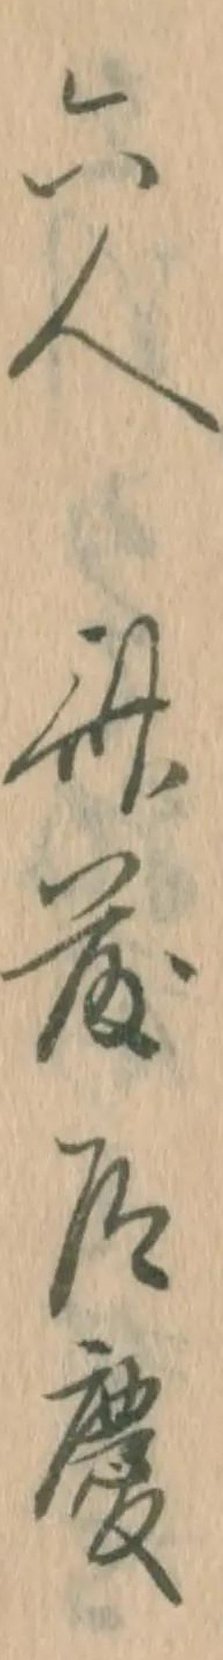六人斎藤道慶
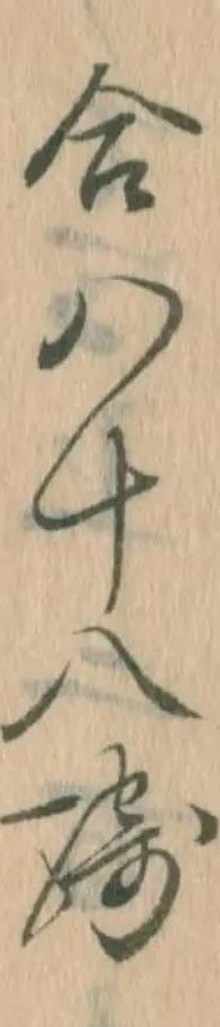合八十八騎
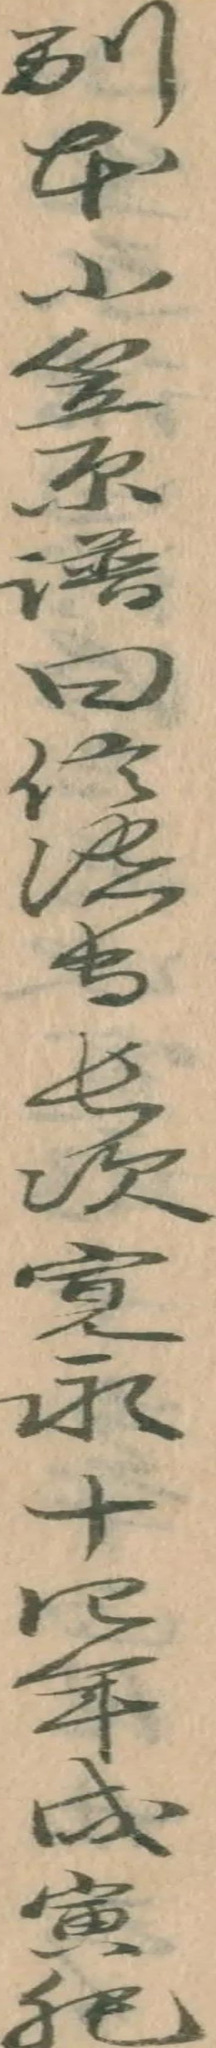別本小笠原譜曰信濃守長次寛永十四年戌寅肥
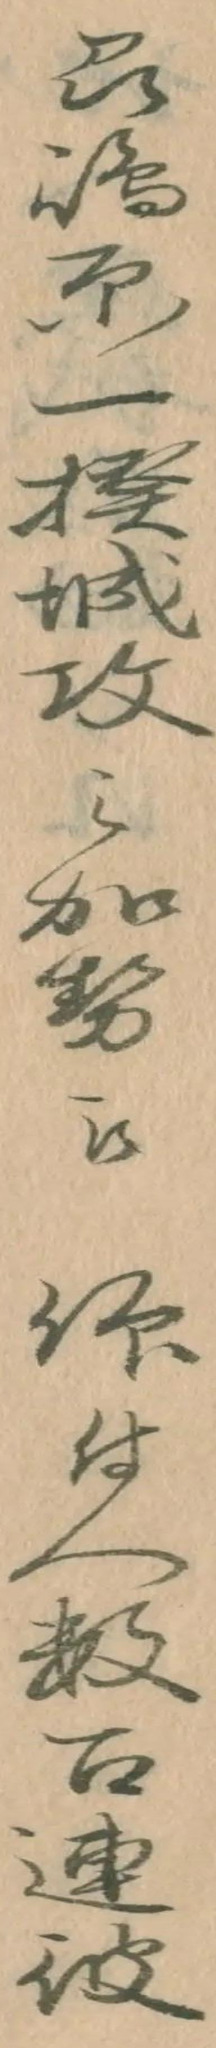州島原一揆城攻之加勢被仰付人数召連彼

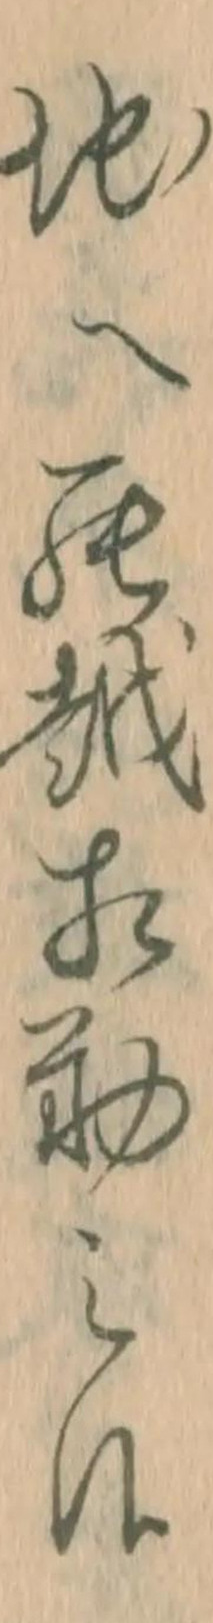地へ罷越相勤之候
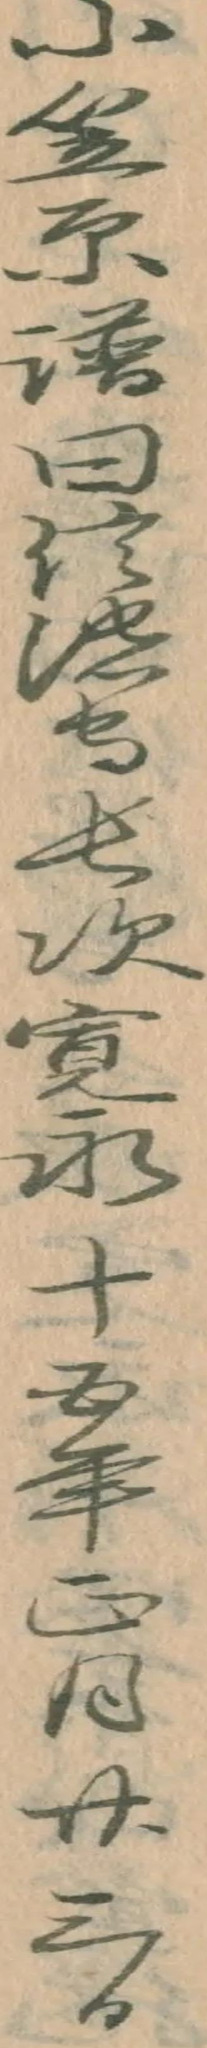小笠原譜曰信綱守長次寛永十五年正月廿三日
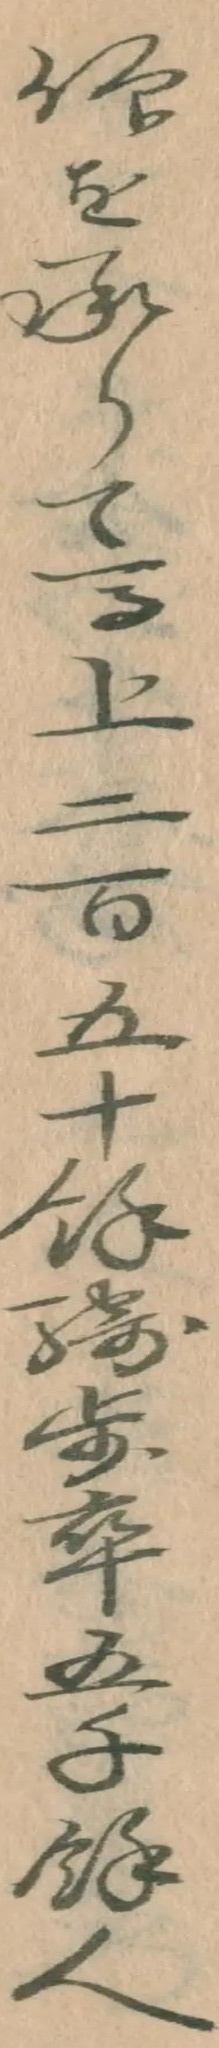仰を承りて馬上二百五十余騎歩卒五千余人
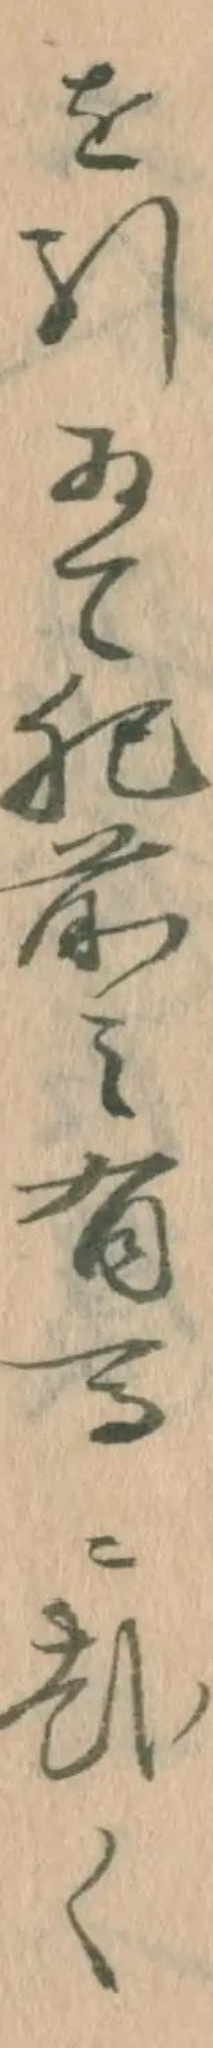を引ゐて肥前之有馬に赴く
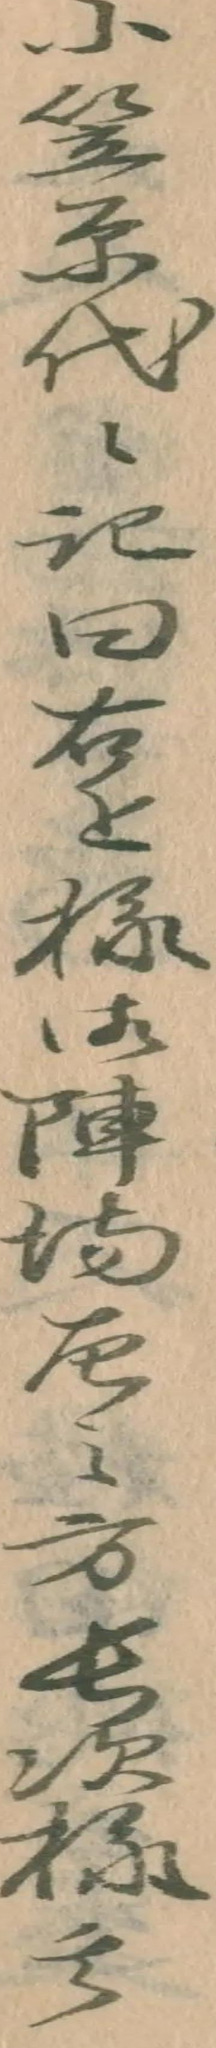小笠原代々記曰右近様御陣場左之方長次様其
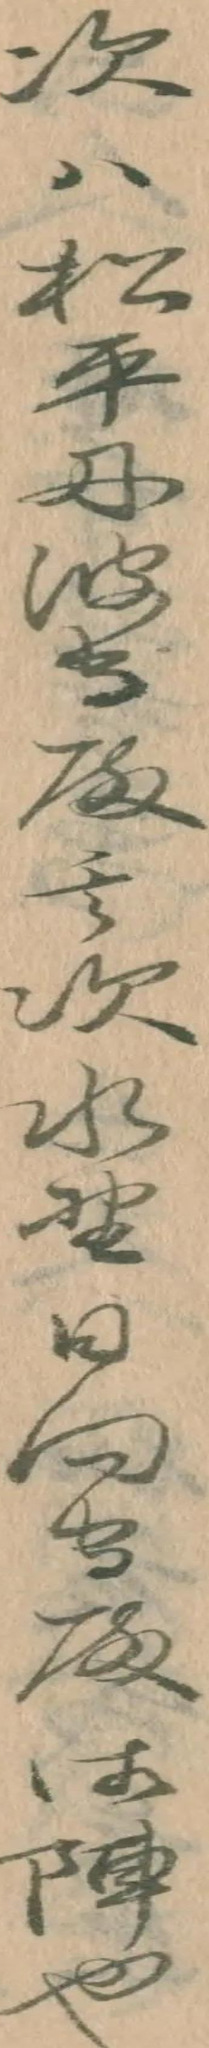次は松平丹波守殿其次水野日向守殿御陣也
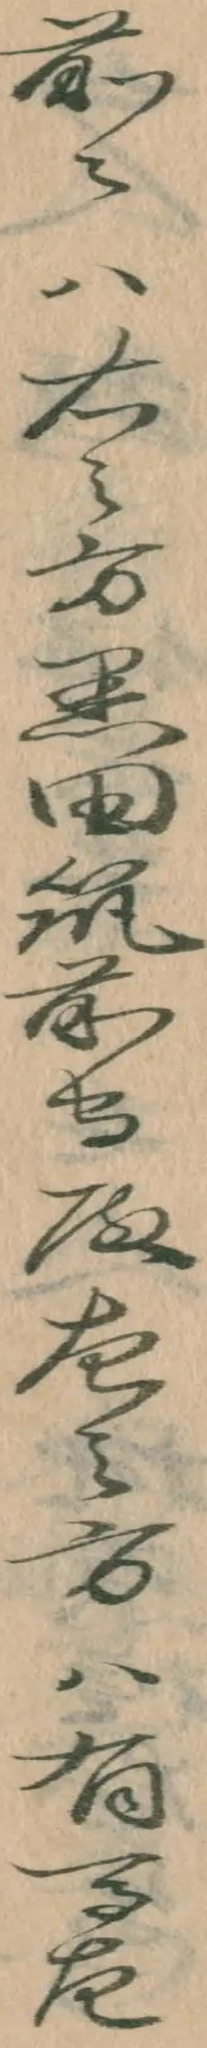前には右之方黒田筑前守殿左之方は有馬左
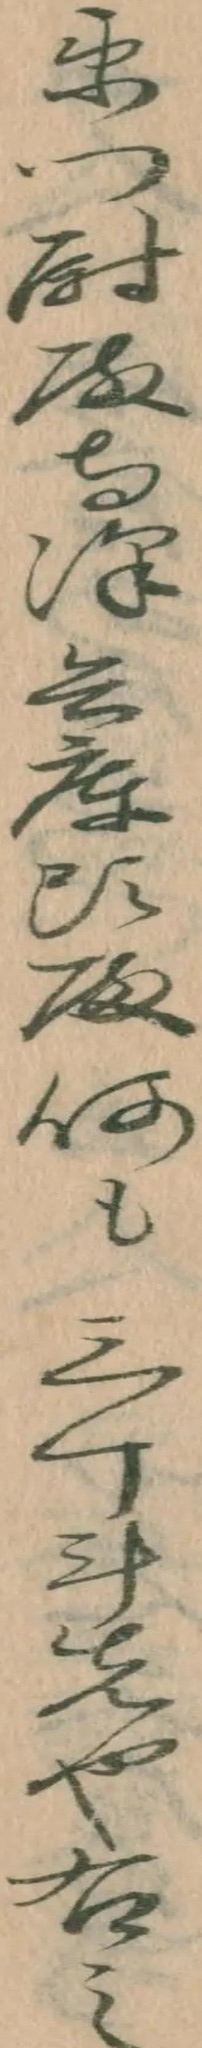衛門尉殿寺沢兵庫頭殿何も三十斗先也右之
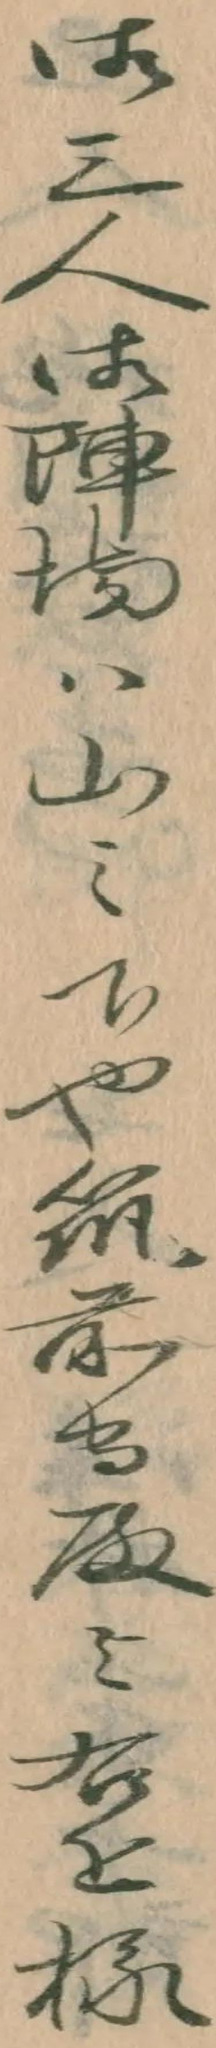御三人御陣場は山之下也筑前守殿与右近様
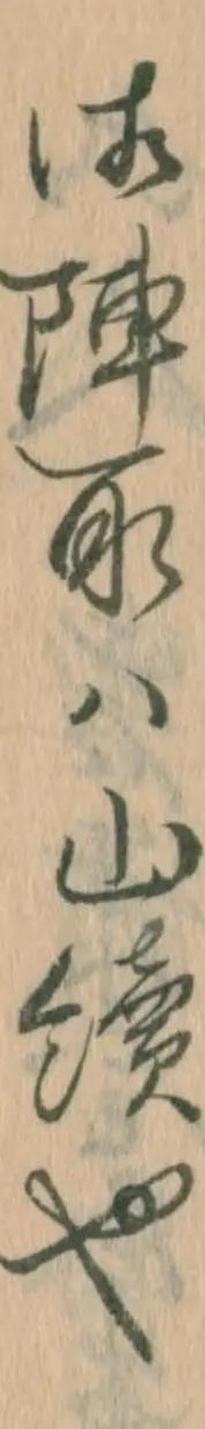御陣取は山続也
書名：切支丹御退治記 49巻. [6]
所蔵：国立国会図書館 National Diet Library, JAPAN
